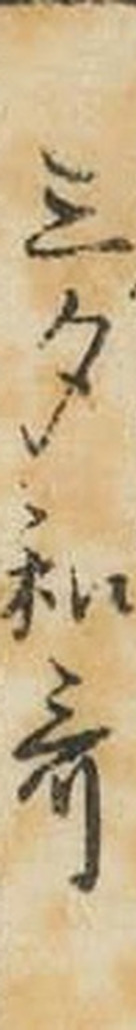三夕和哥
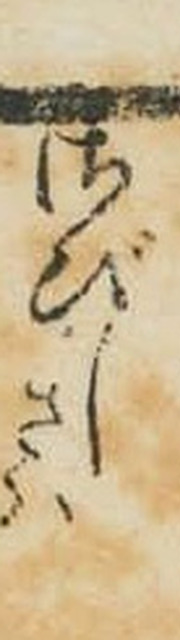さびしさは
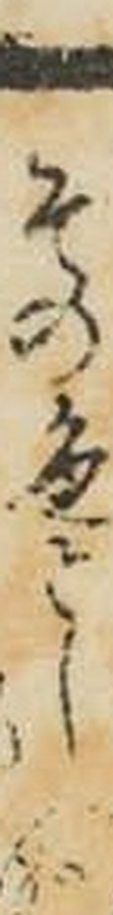その色とし
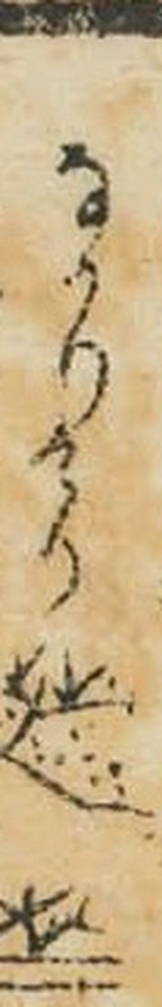なかりけり
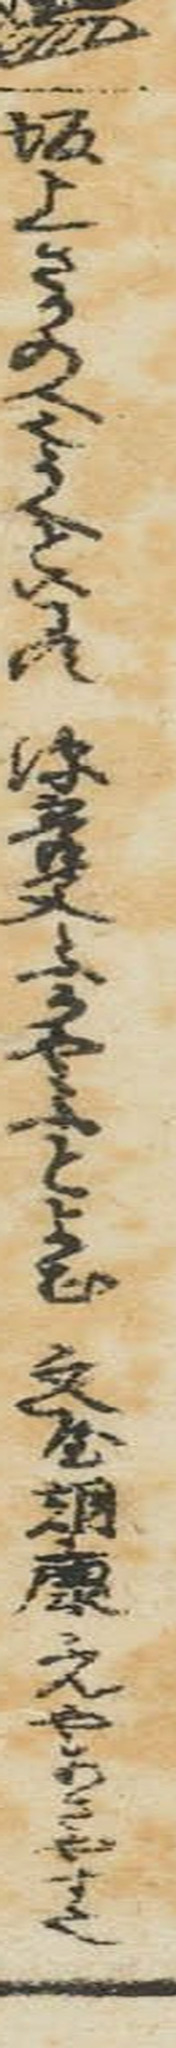坂上さかのへ也うへといわす深養父ふかやふとよむ文屋朝康ふんやあさやす也
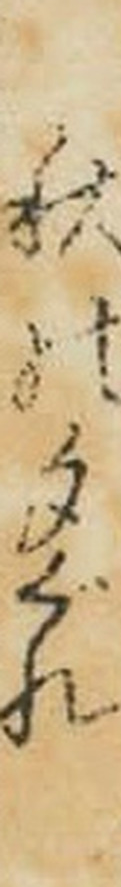秋の夕ぐれ
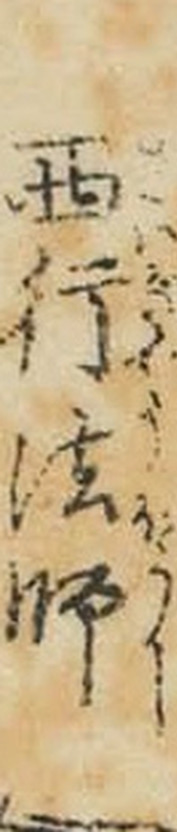西行法師
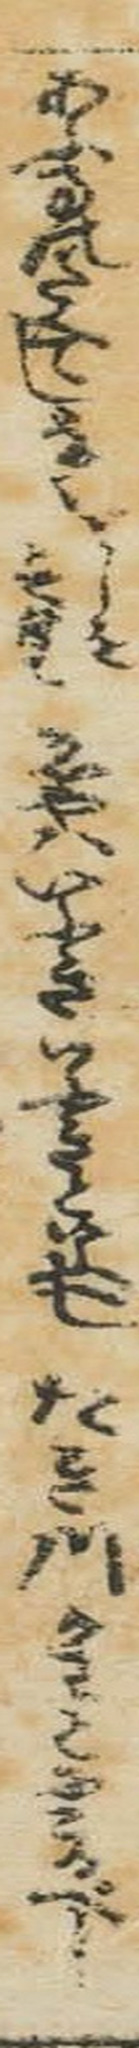あふ事のたへてしなくしを上へ付てゑやはいふきいふきといふへしたき川かわとにこるべし
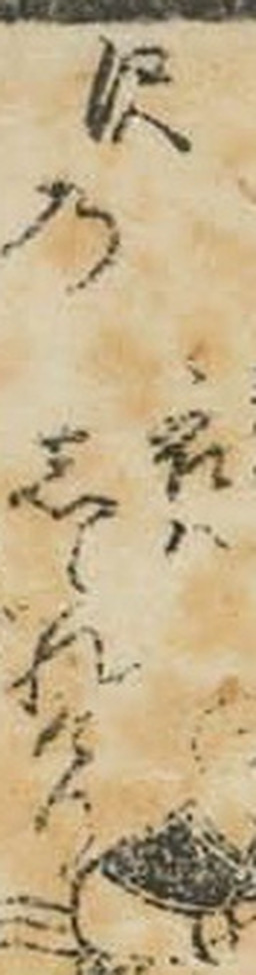沢のしられけり
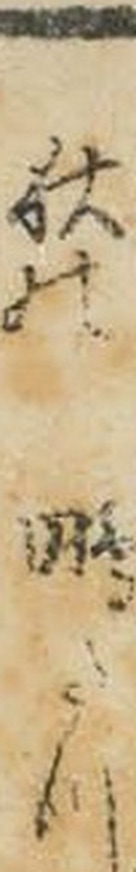秋の鴫たつ
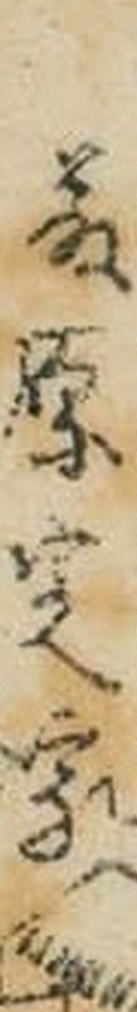藤原定家
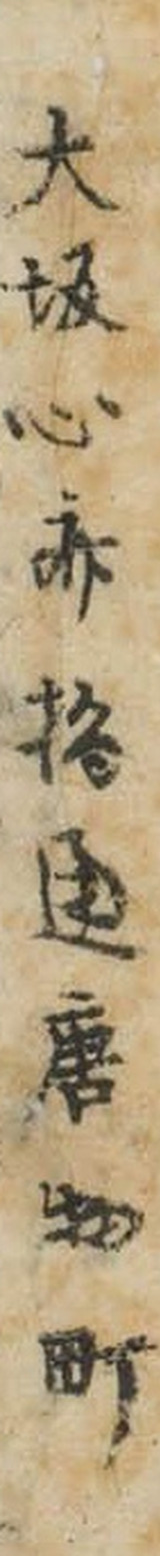大坂心斎橋通唐物町
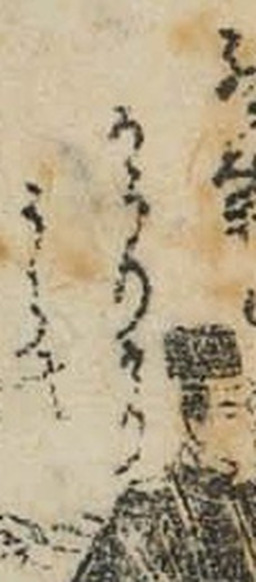なかりけり
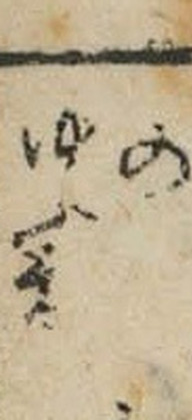ゆふ暮
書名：女大学
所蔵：東京学芸大学教育コンテンツアーカイブ
